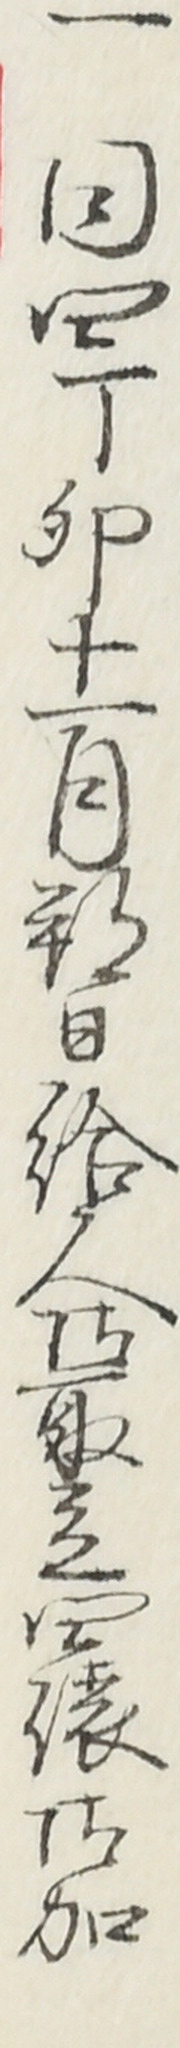一同四丁卯十一月朔日給人御取立四俵御加

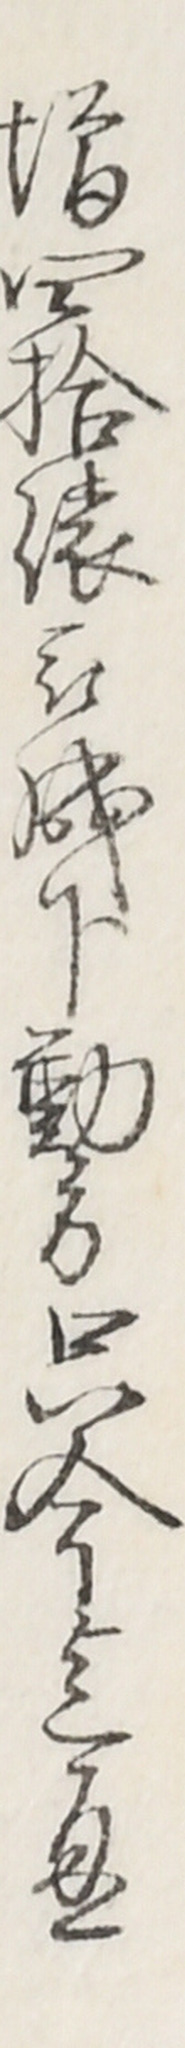増四拾俵被成下勤方只今迄通
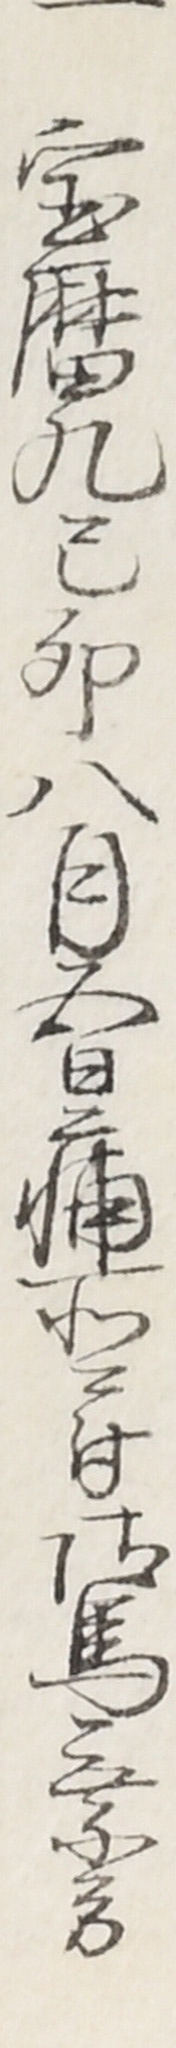一宝暦九己卯八月五日痛所ニ付御馬乗方
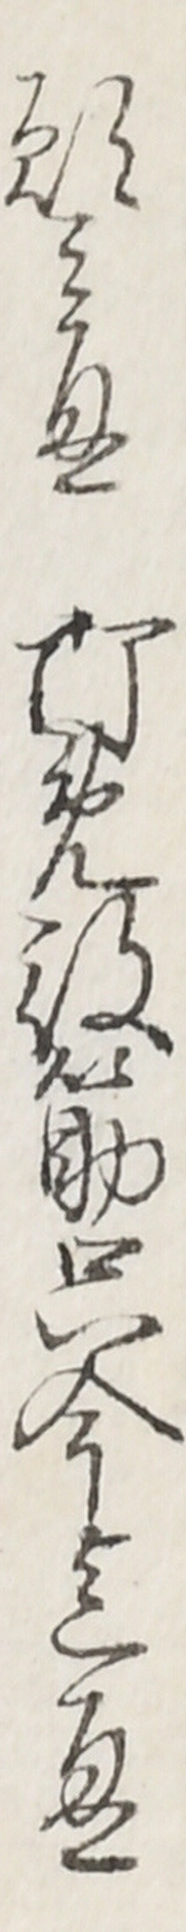願之通御免役筋只今迄通
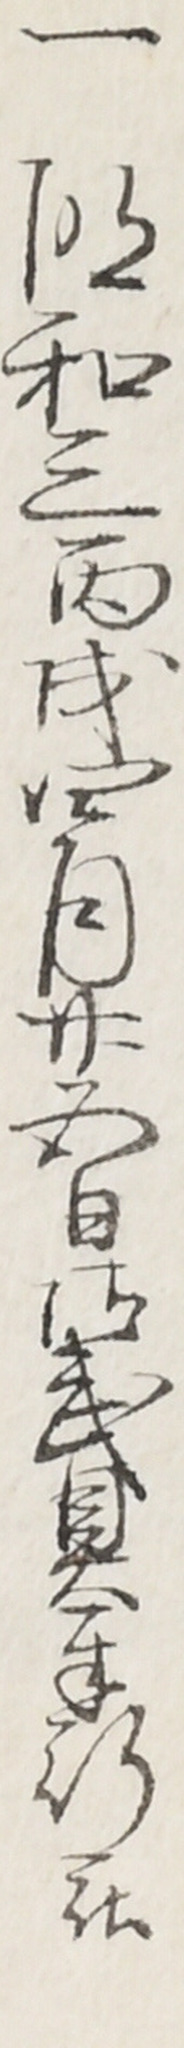一明和三丙戌四月廿五日御武具奉行被
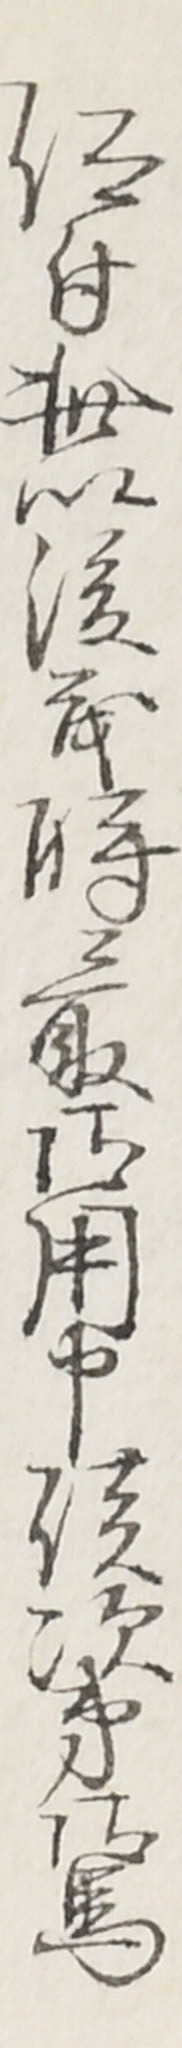仰付此以後茂時ニ取御用申談次第御馬
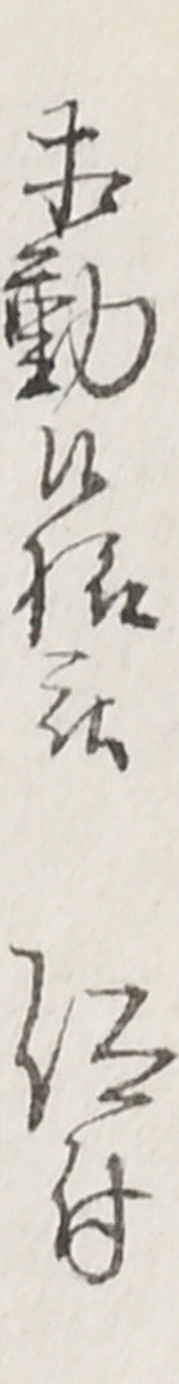御勤候様被仰付
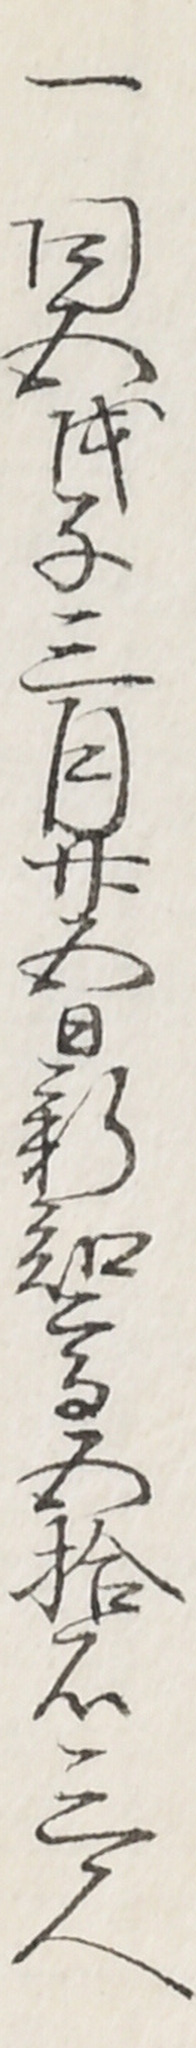一同五戊子三月廿五日新知高五拾石三人
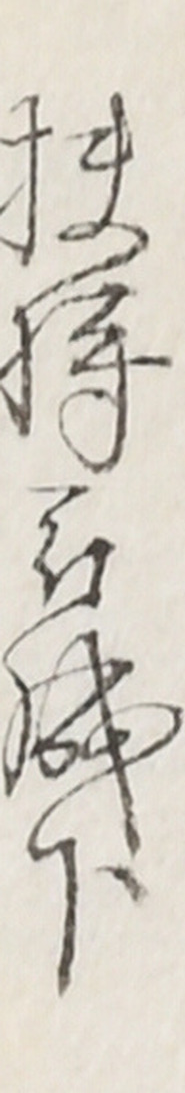扶持被成下
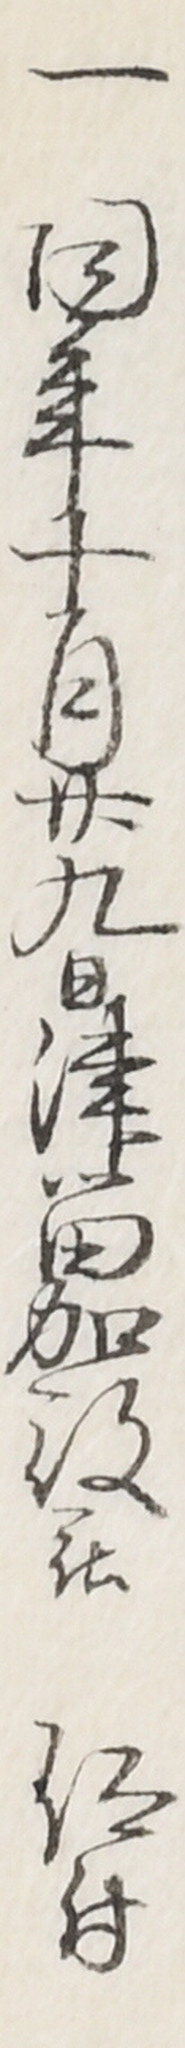一同年十月廿九日津留加役被仰付
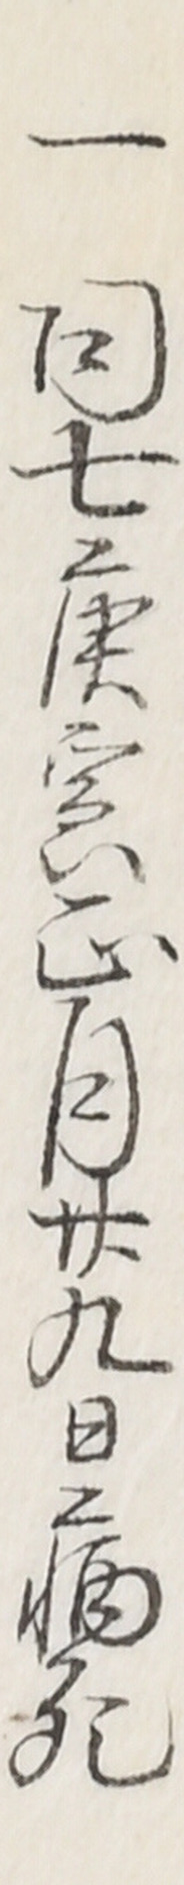一同七庚寅正月廿九日病死
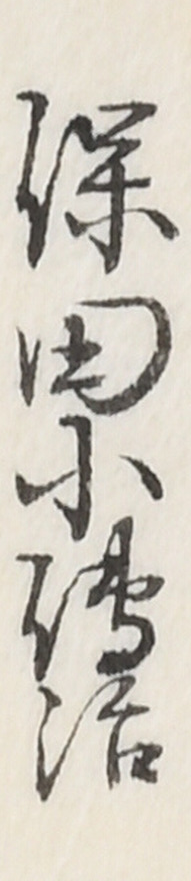保田小伝治
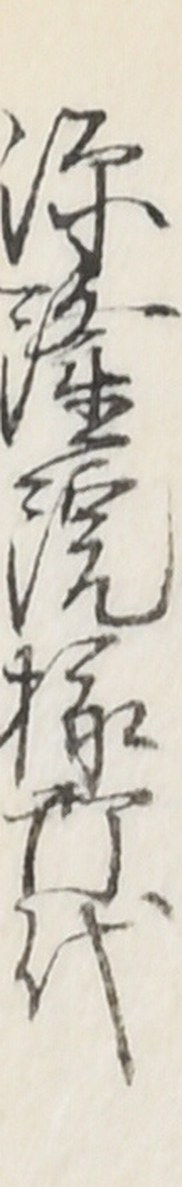源隆院様御代
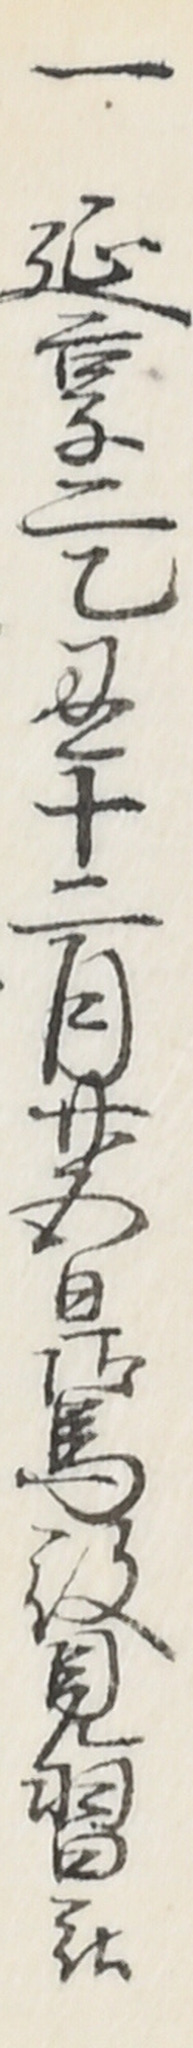一延享二乙丑十二月廿五日御馬役見習被
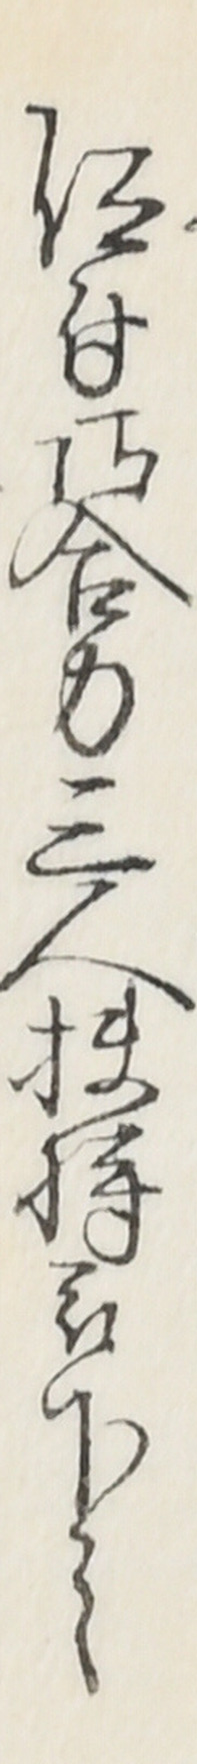仰付御合力三人扶持被下之
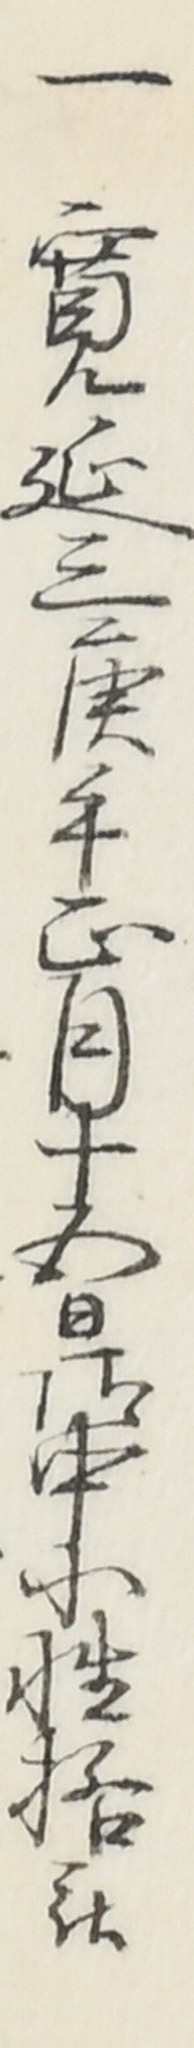一寛延三庚午正月十五日御中小性格被
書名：給人諸士勤仕録（七）
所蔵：伊那市立高遠町図書館・合同会社AMANE
